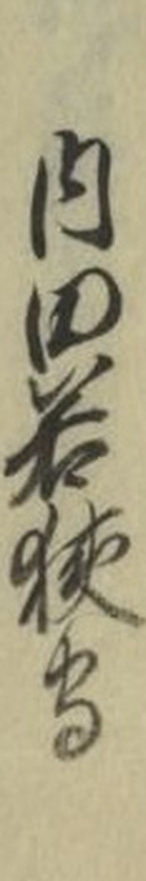内田若狭守
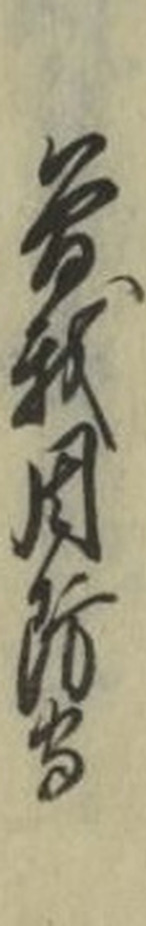曽我周防守
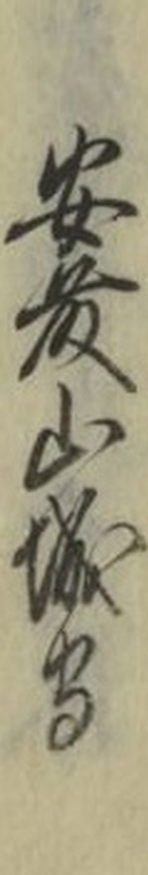安藤山城守
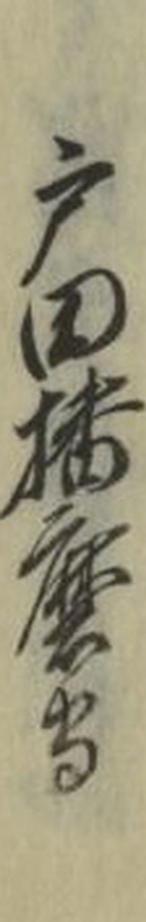戸田播磨守
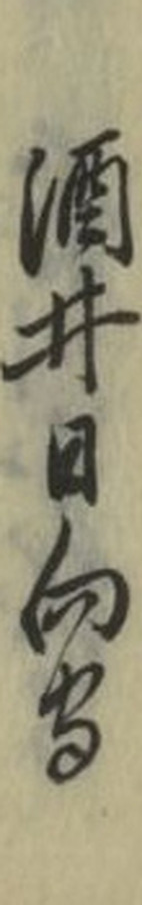酒井日向守

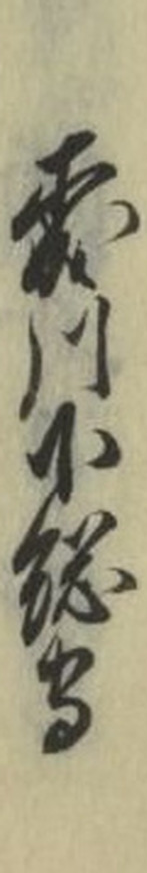森川下総守
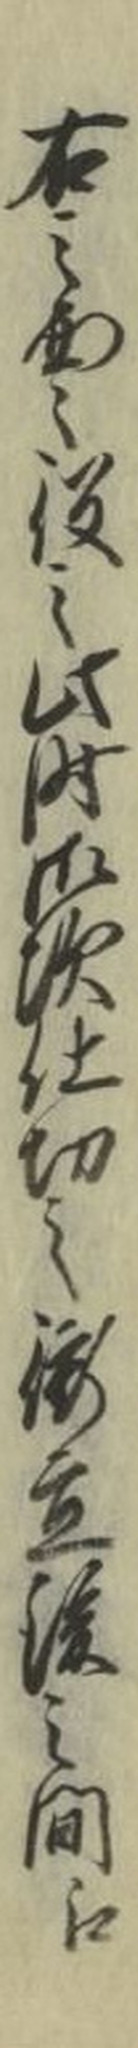右之面々役之此時御次仕切之衝立後之間え
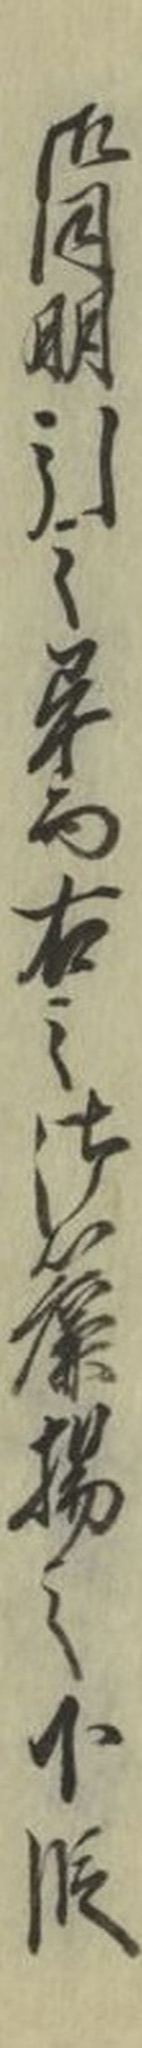御同朋引之畢而右之御簾揚之下段
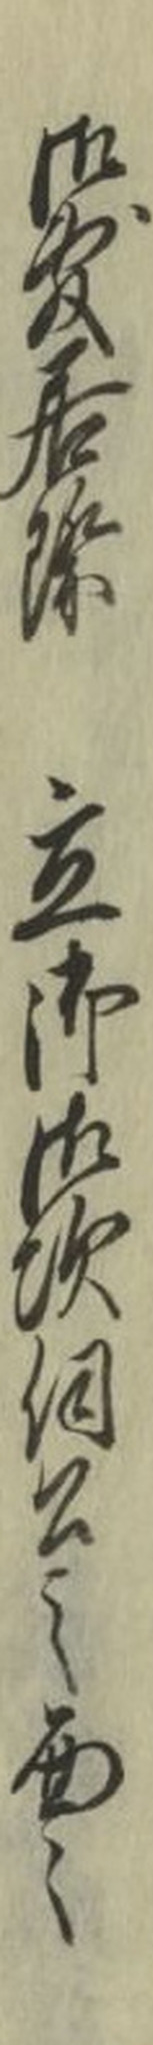御敷居際立御御次伺公之面々
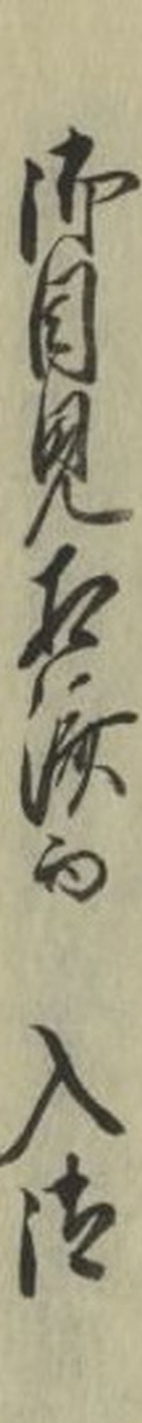御目見相済而入御
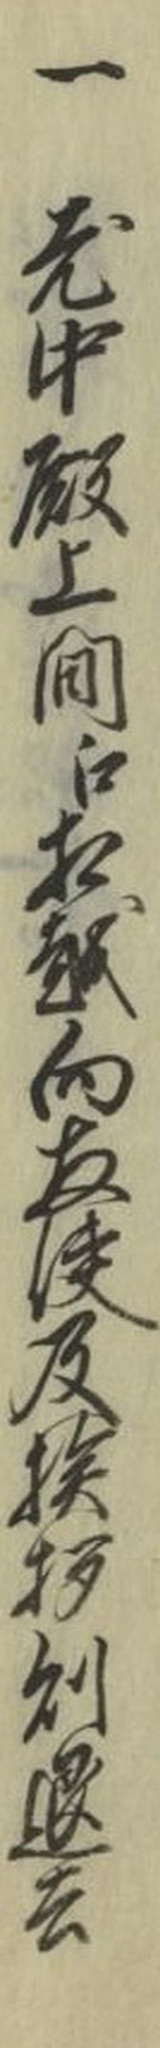一老中殿上間え相越而両使及挨拶則退去
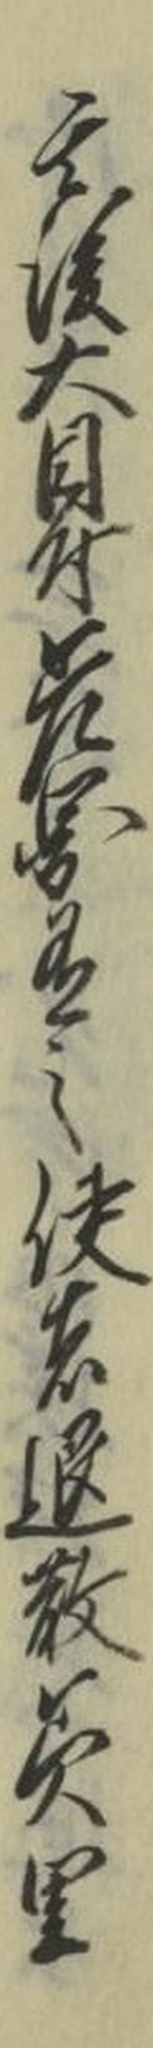其後大目付差図有之使者退散美里
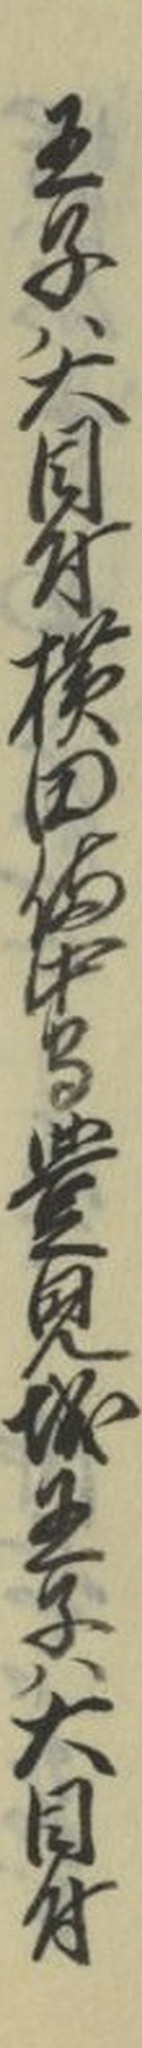王子は大目付横田備中守豊見城王子は大目付
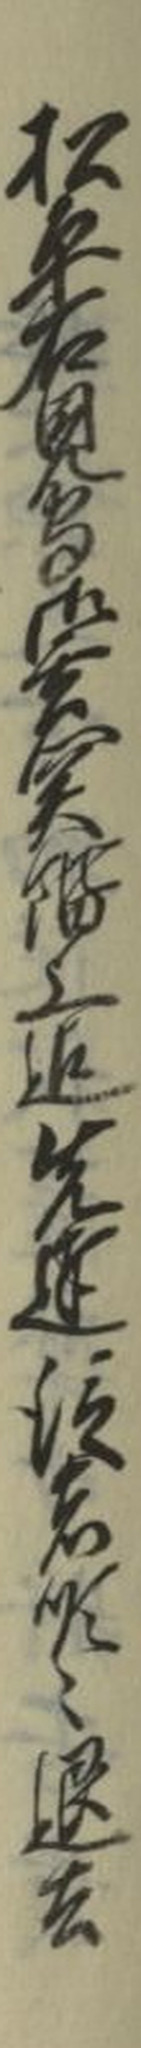松平石見守御玄関階上迄先達従者順々退去
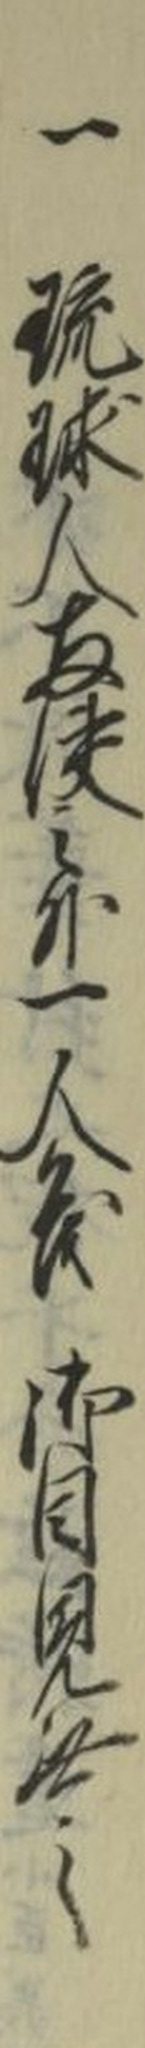一琉球人両使之外一人も御目見無之
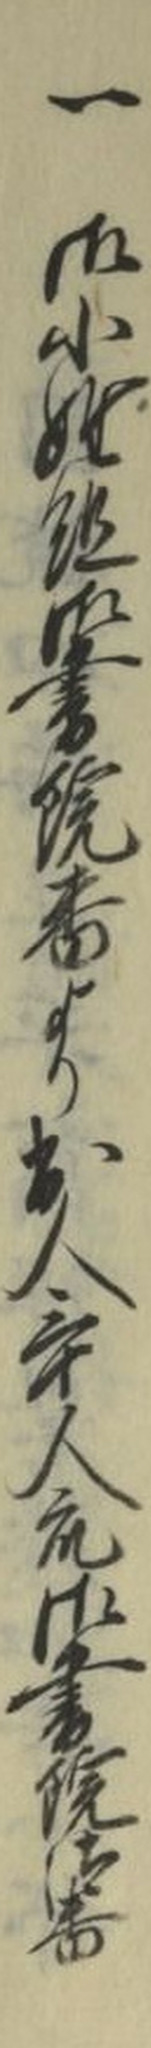一御小姓組御書院番より出人三十人衆御書院御番
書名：琉球人参府記
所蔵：University of the Ryukyus Library
